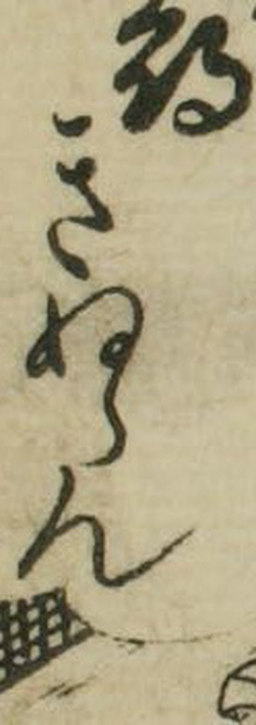きぬらん

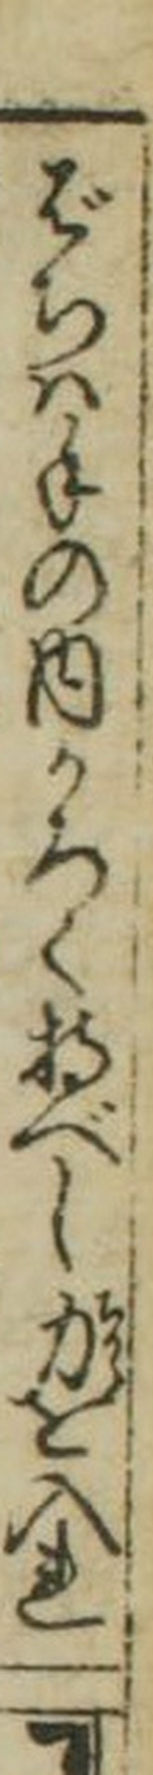ばちは手の内かろく持べし力を入れ
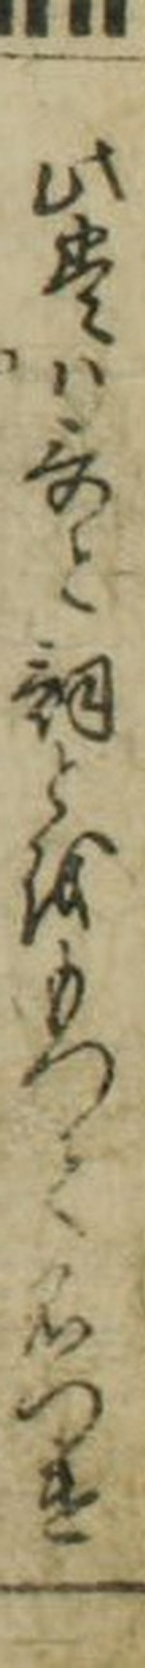此巻は哥と詞とをもつて名つけ
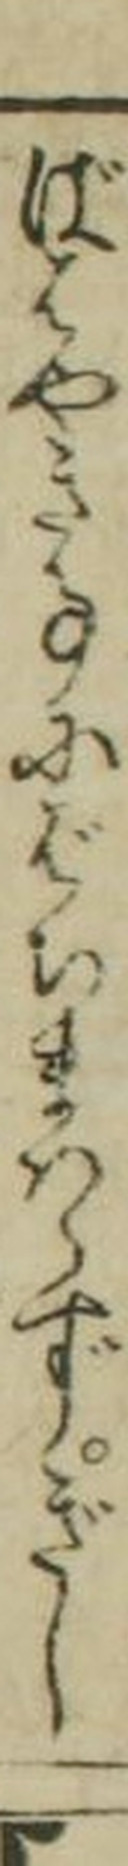ばはやき事にばちまはらず。ぎし
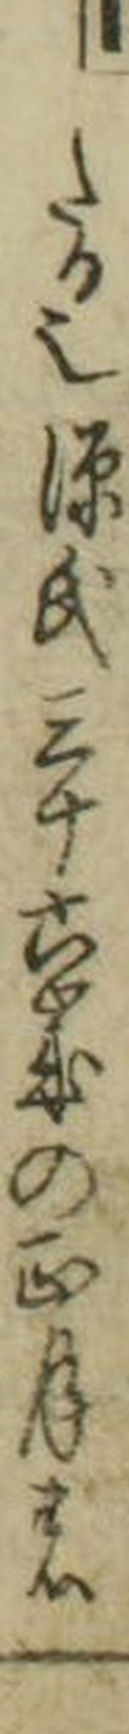たる也。源氏三十六歳の正月の
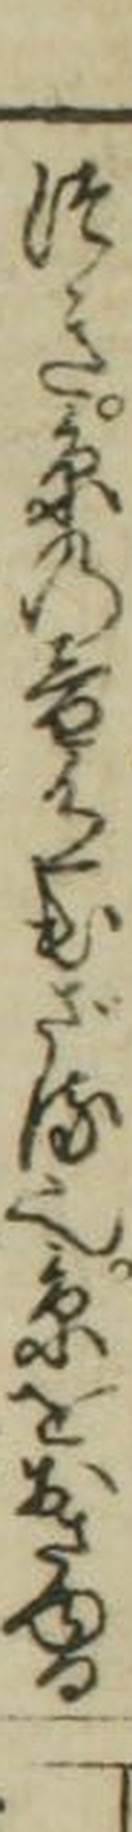つき。糸の音色出ざる也。糸をおさゆる
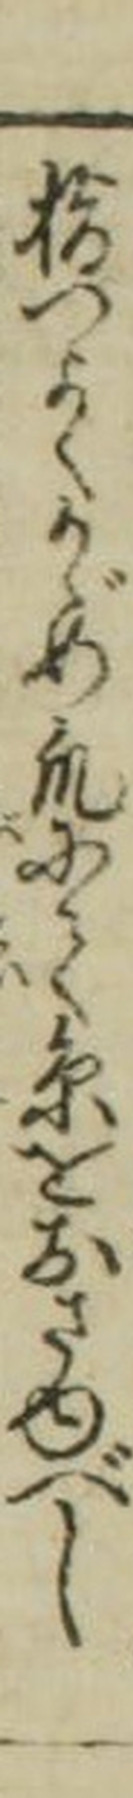指つよくかゞめ爪にて糸をおさゆべし
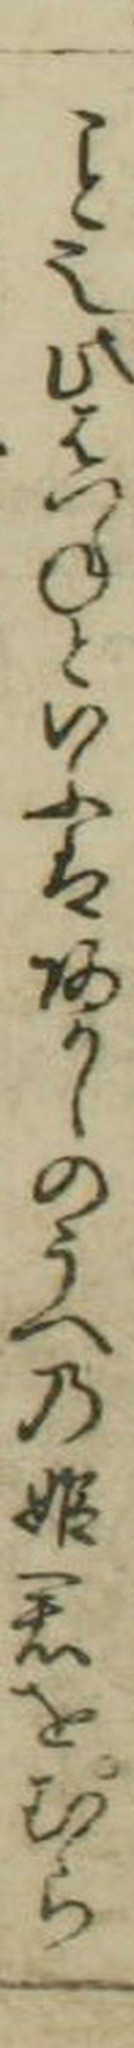こと也。此はつねといふはあかしのうへの姫君を。むら
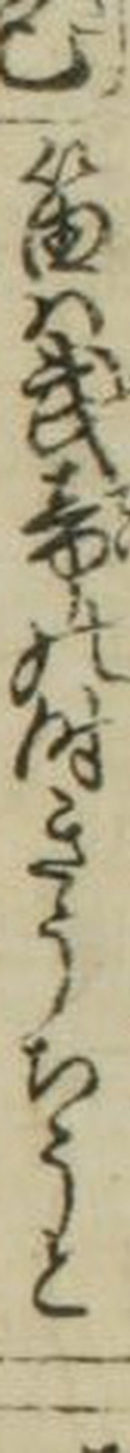笛は武帝の時きうちうと
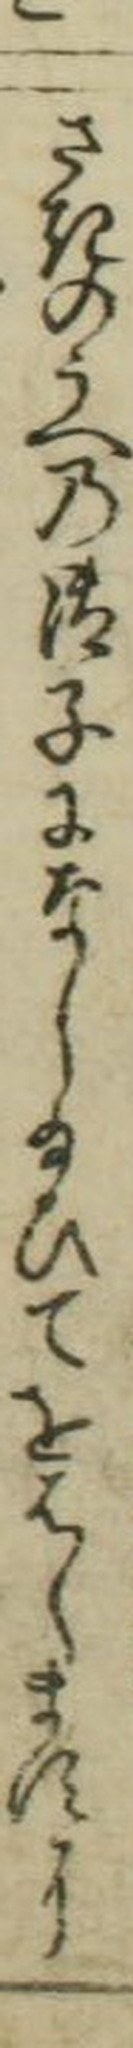さきのうへの御子になし給ひてをはしますに
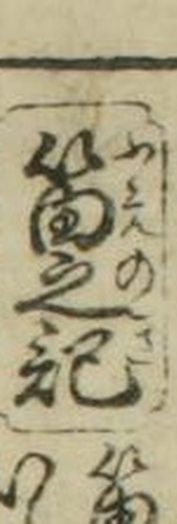笛之記
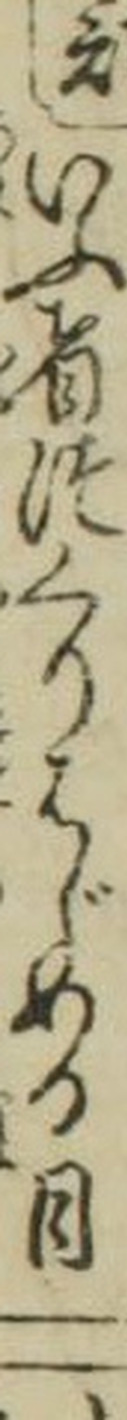いふ者つくりはじめる日
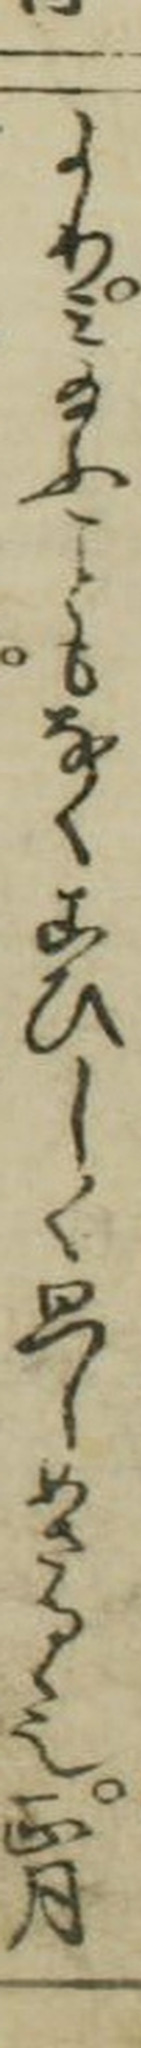より。み給ふこともなくこひしく思しめさるゝ也。正月
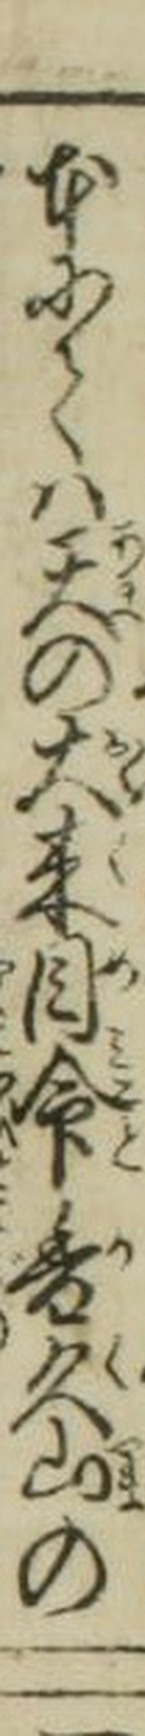本にては天の大来目命香久山の
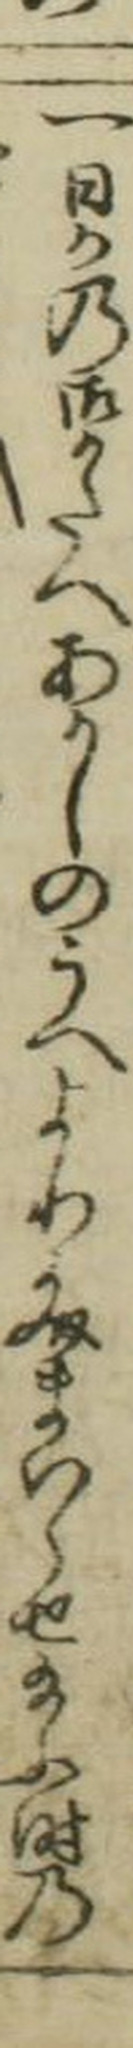一日かの御かたへ。あかしのうへより文まいらせ給ふ時の
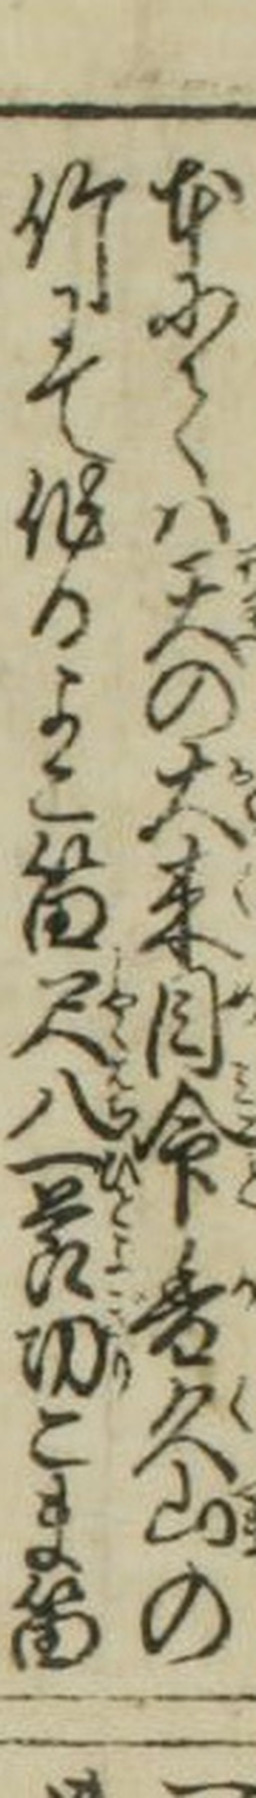竹にて作るよこ笛尺八一節切こま笛
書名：女源氏教訓鑑
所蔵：東京学芸大学附属図書館
